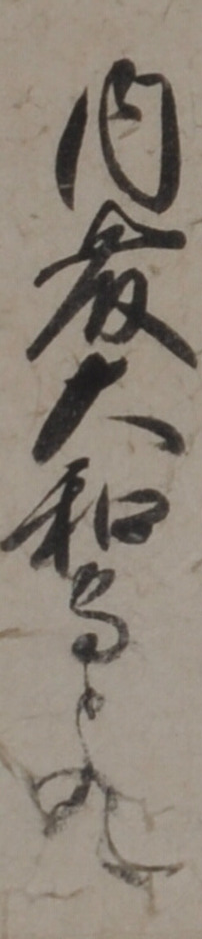内藤大和守とのへ
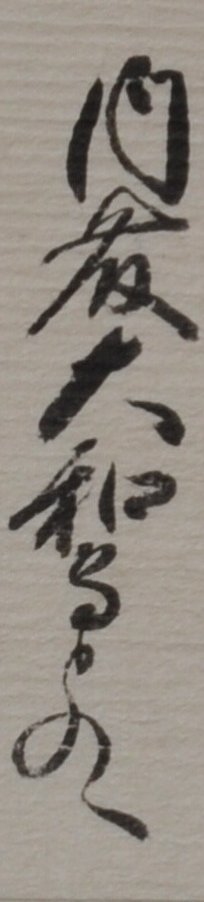内藤大和守とのへ

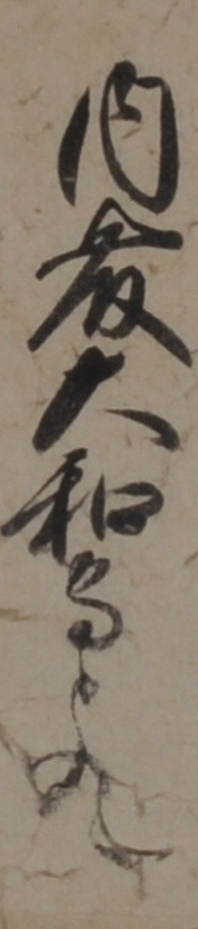内藤大和守とのへ
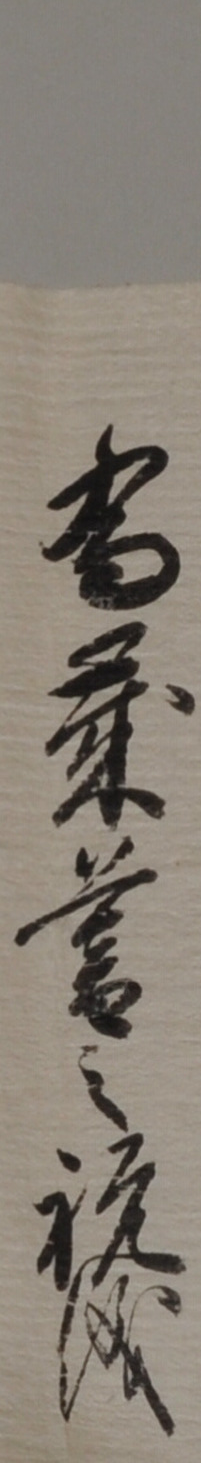為歳暮之祝儀
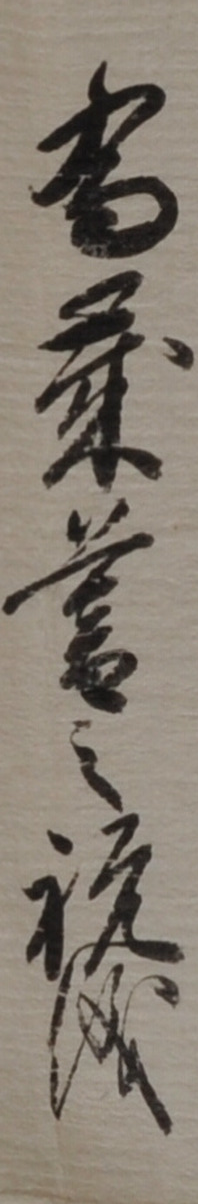為歳暮之祝儀
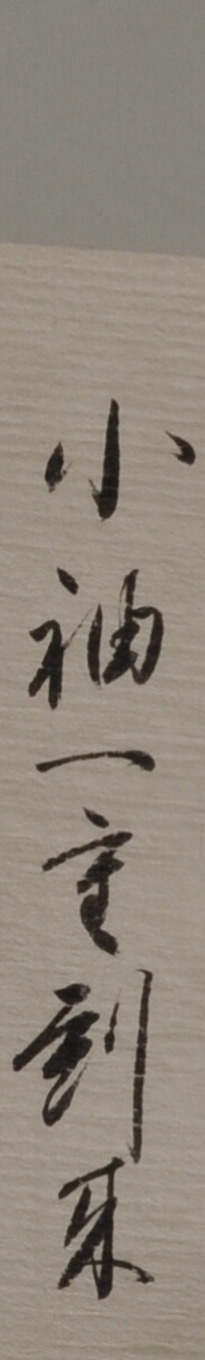小袖一重到来
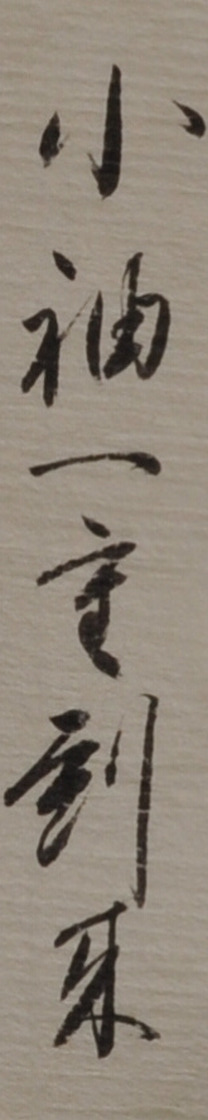小袖一重到来
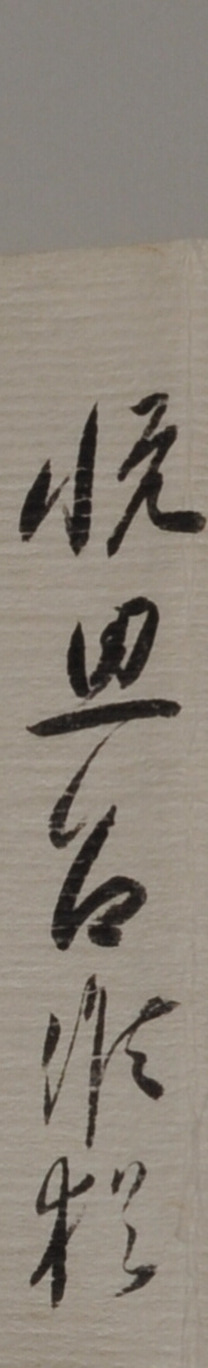悦思召候猶
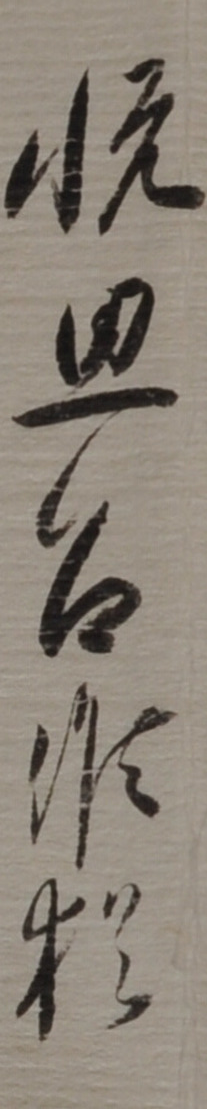悦思召候猶
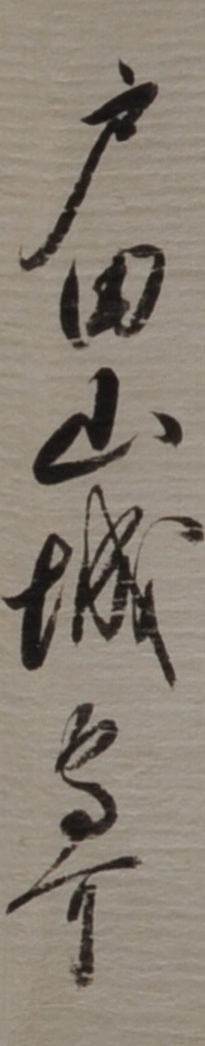戸田山城守可
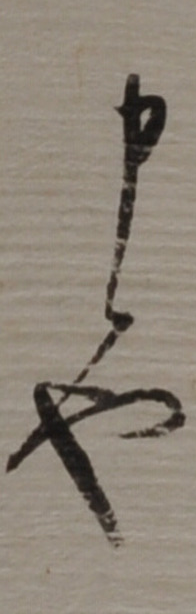申候也
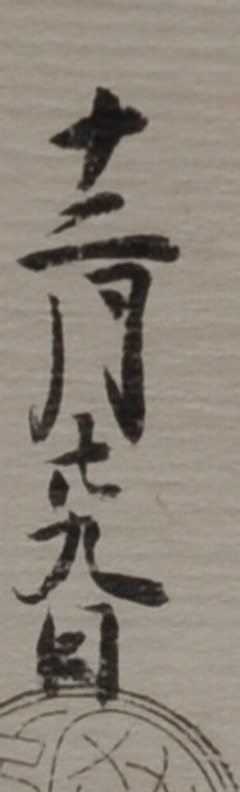十二月廿九日
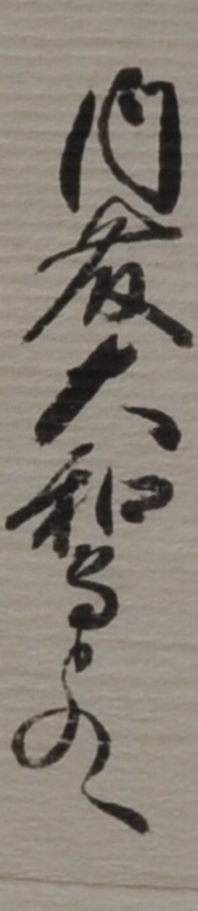内藤大和守とのへ
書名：御内書
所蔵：伊那市立高遠町図書館・合同会社AMANE
